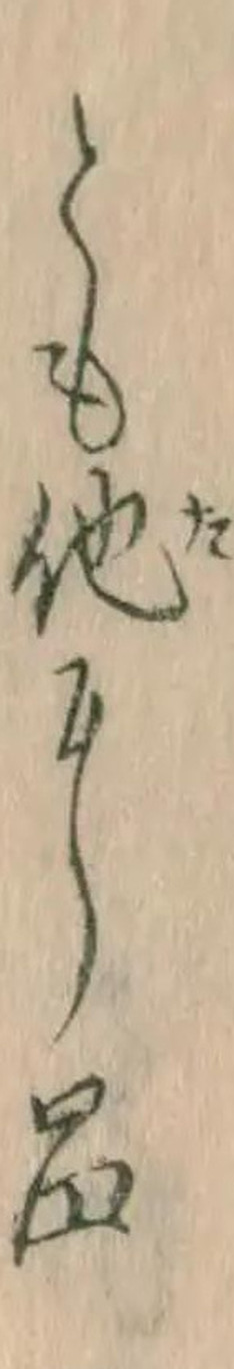とも他に品
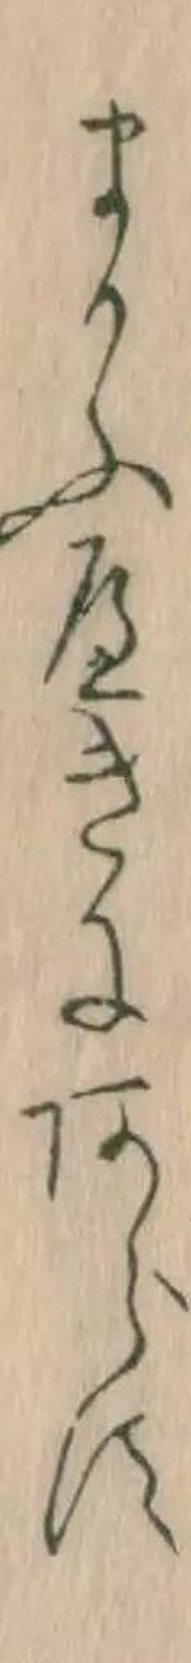まかふへきにあらす
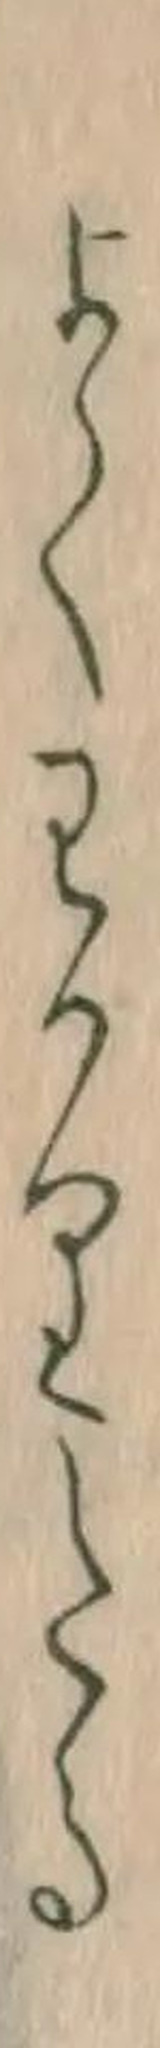よくわかりたる
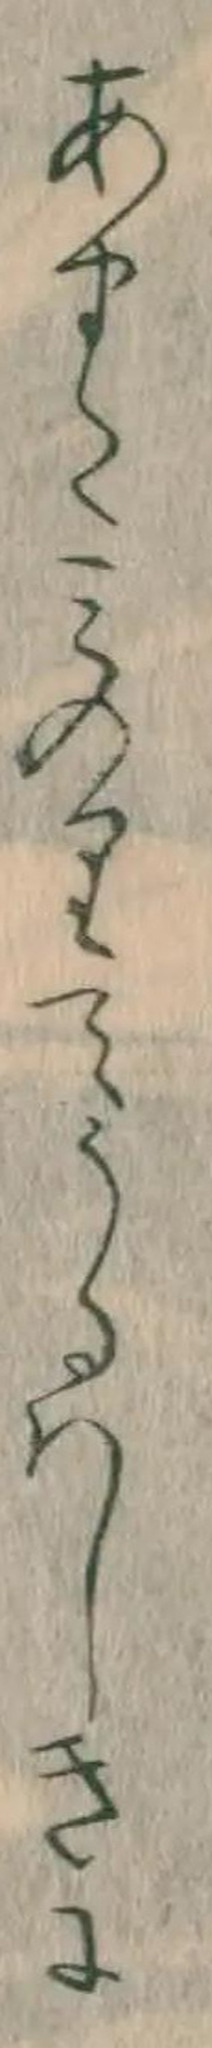あまたみのりてうるはしきに
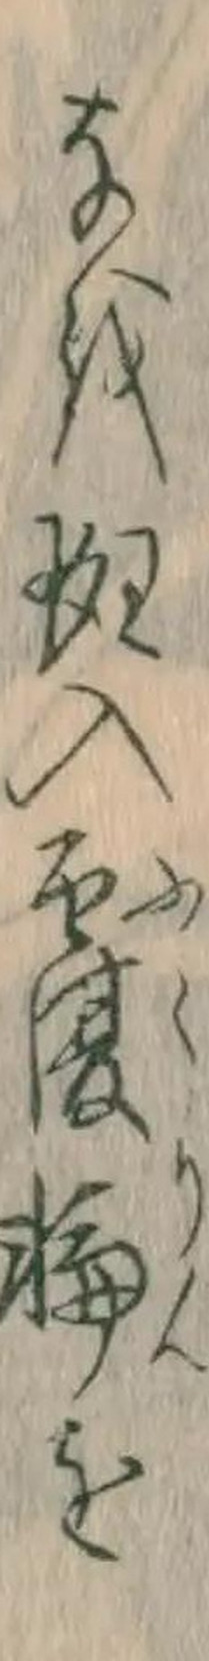なを斑入覆輪を
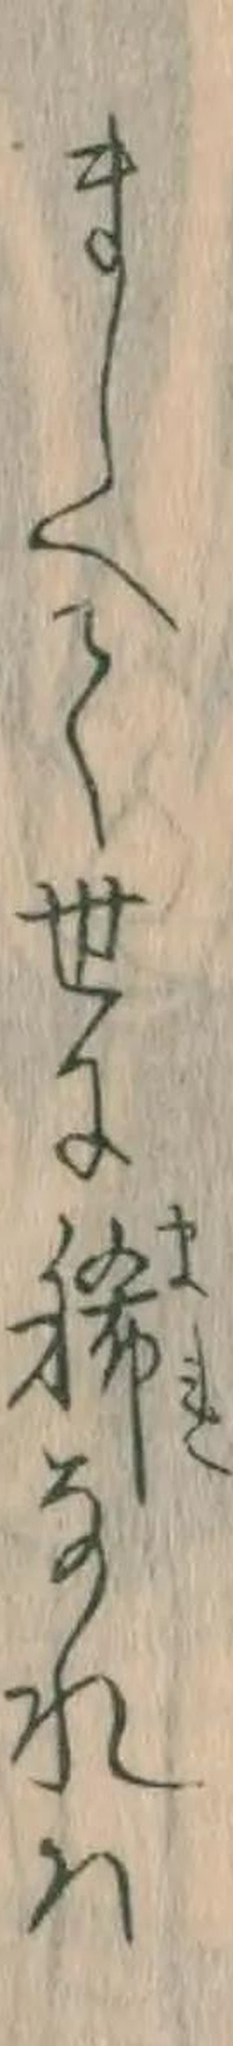ましへて世に稀なれは
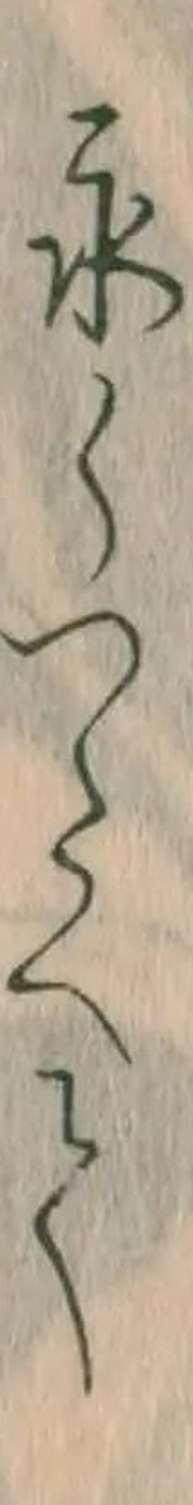永くつたへて
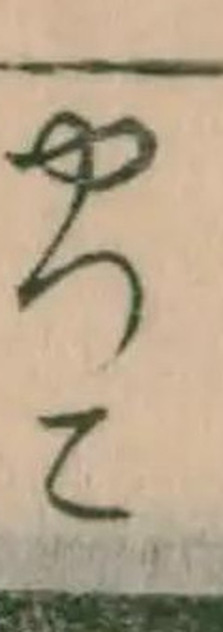やつこ
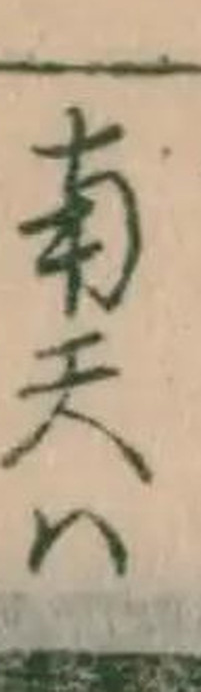南天は
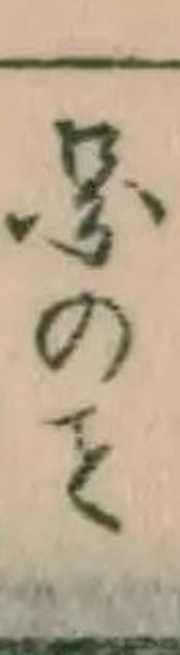図のこと
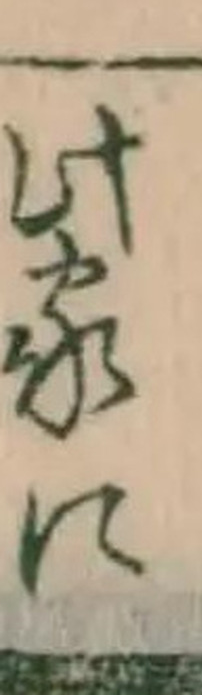此家に
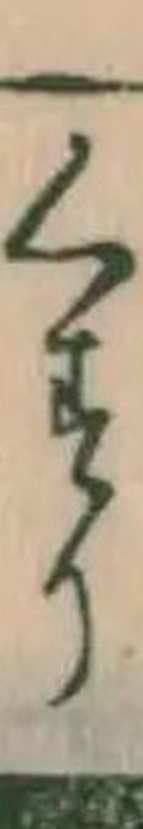くすり
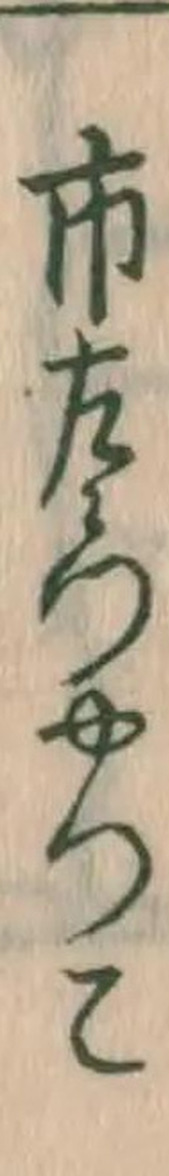市左衛門やつこ
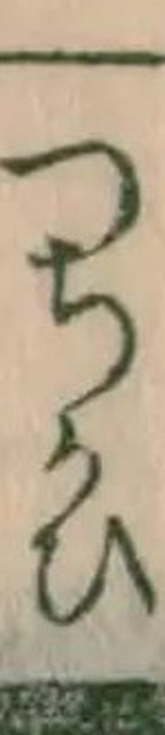つちかひ
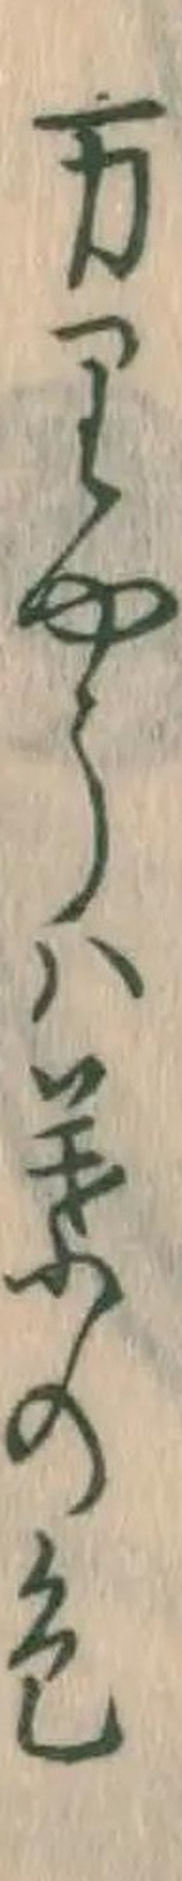万りやうは葉の色
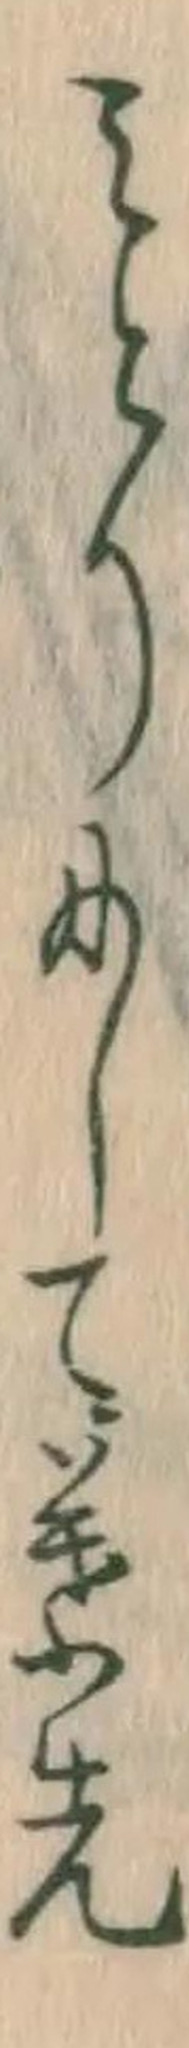みとりにして葉先
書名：草木奇品家雅見 3巻. [3]
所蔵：国立国会図書館 National Diet Library, JAPAN
